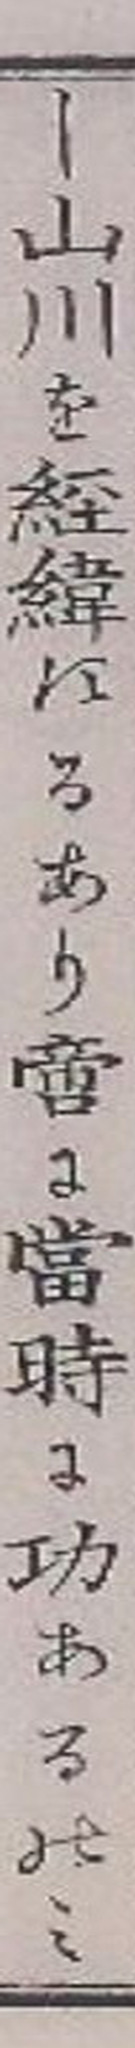し山川を経緯するあり啻に当時に功あるのみ
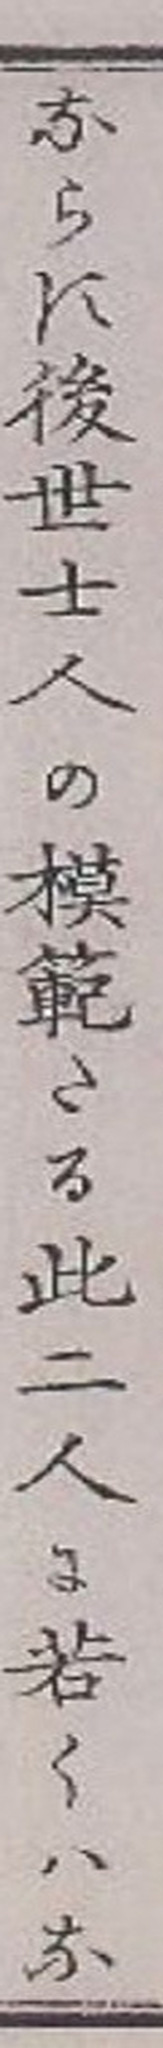ならす後世士人の模範たる此二人に若くはな
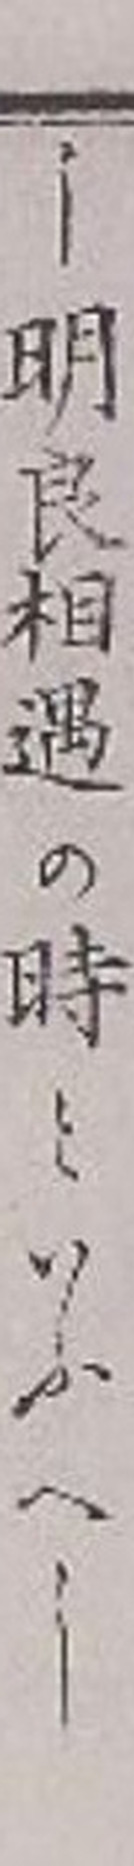し明良相遇の時といふへし
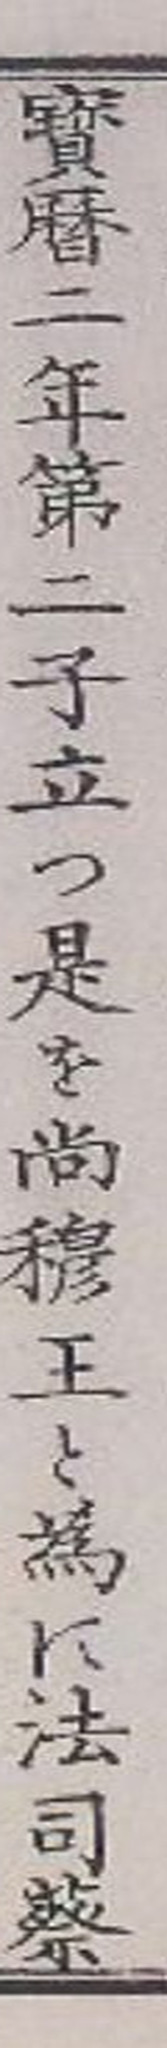宝暦二年第二子立つ是を尚穆王と為す法司蔡
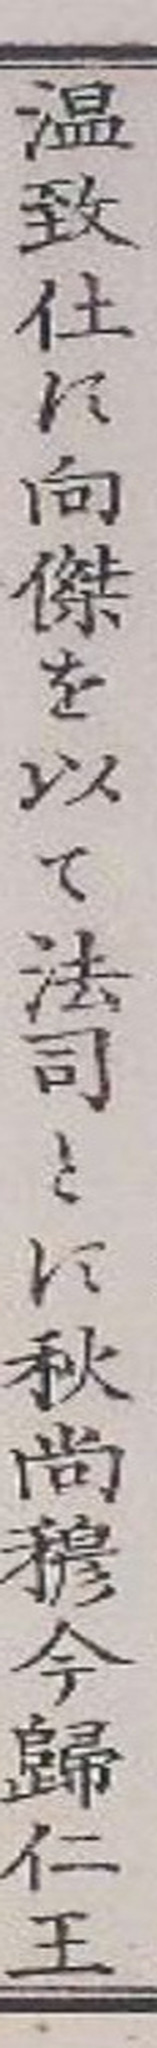温致仕す尚傑を以て法司とす秋尚穆今帰仁王
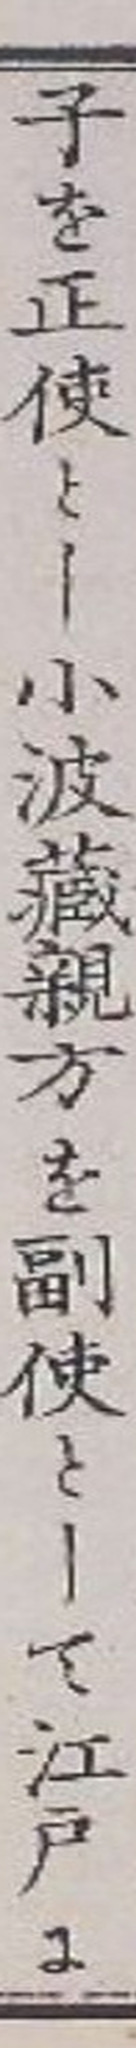子を正使とし小波藏親方を副使として江戸に
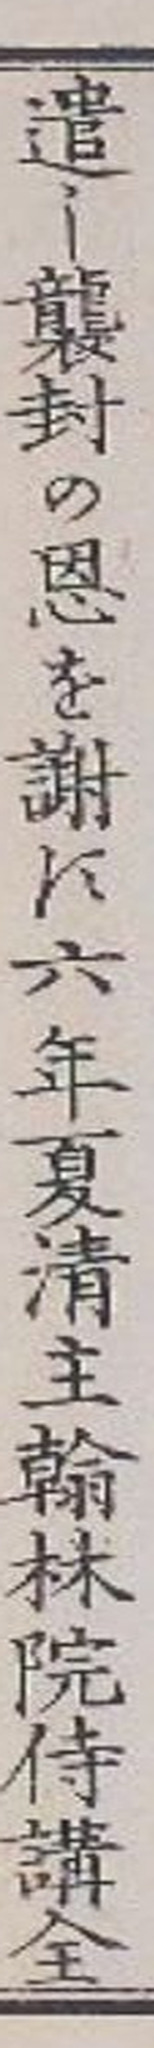遣し襲封の恩を謝す六年夏清主翰林院侍講全
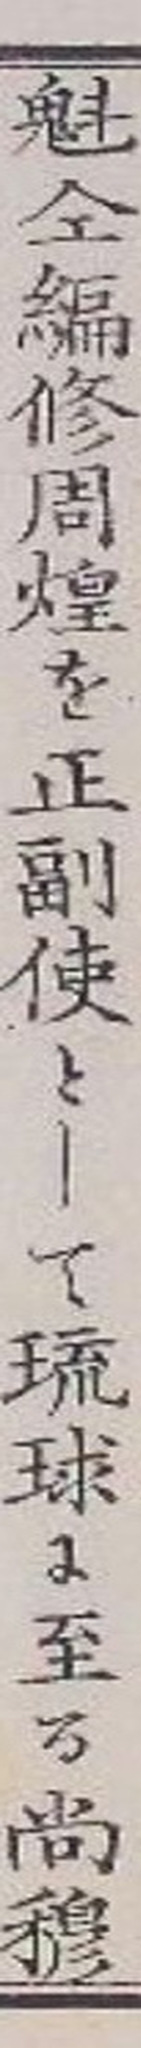魁仝編修周煌を正副使として琉球に至る尚穆
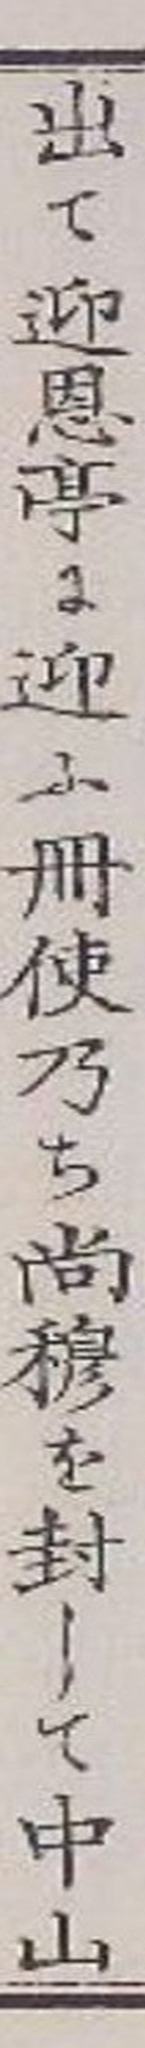出て迎恩亭に迎ふ冊使乃ち尚穆を封して中山
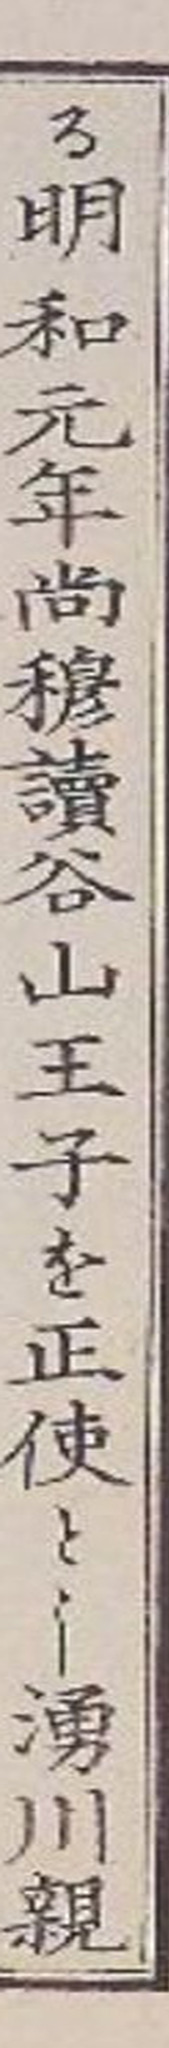る明和元年尚穆読谷山王子を正使とし湧川親
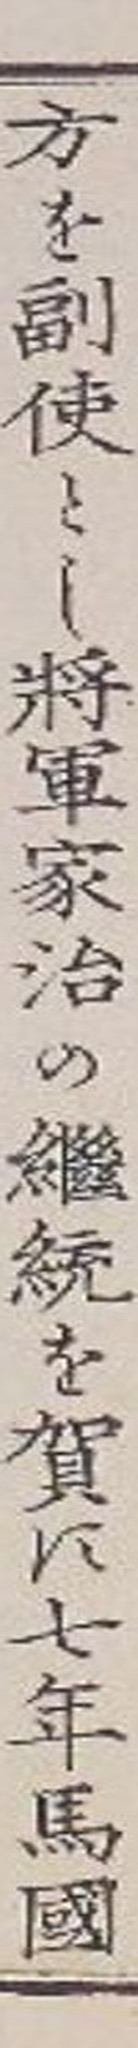方を副使とし将軍家治の継統を賀す七年馬国
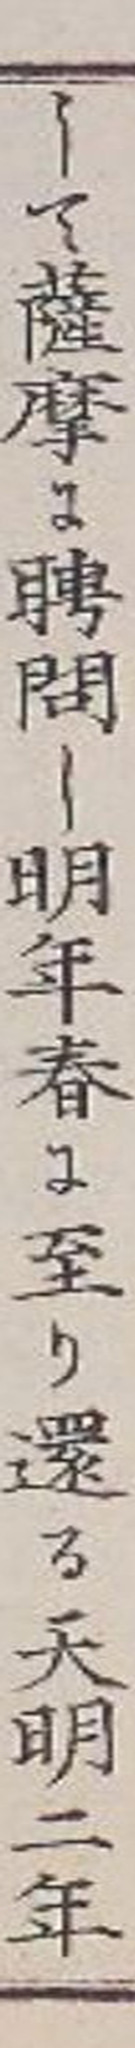して薩摩に聘問し明年春に至り還る天明二年
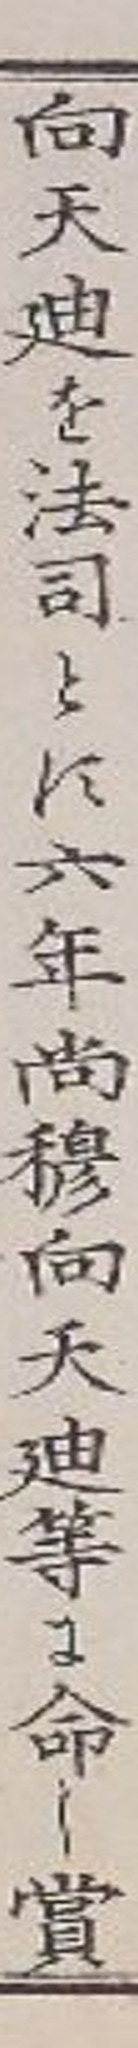向天廸を法司とす六年尚穆向天廸等に命し賞
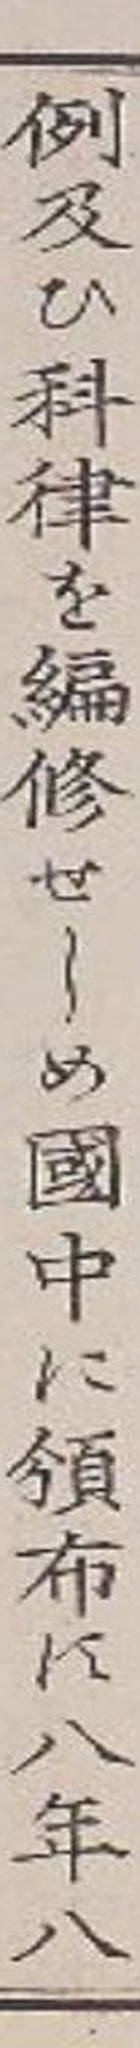例及ひ科律を編修せしめ国中に頒布す八年八
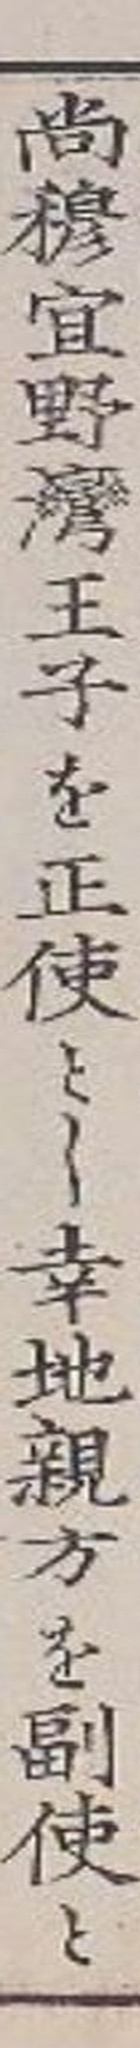尚穆宜野湾王子を正使とし幸地親方を副使と

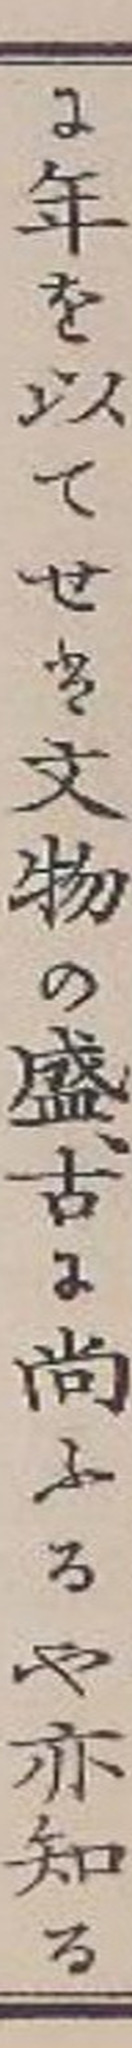に年を以てせ書文物の盛、古に尚ふるや亦知る
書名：南島紀事 下
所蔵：University of the Ryukyus Library
